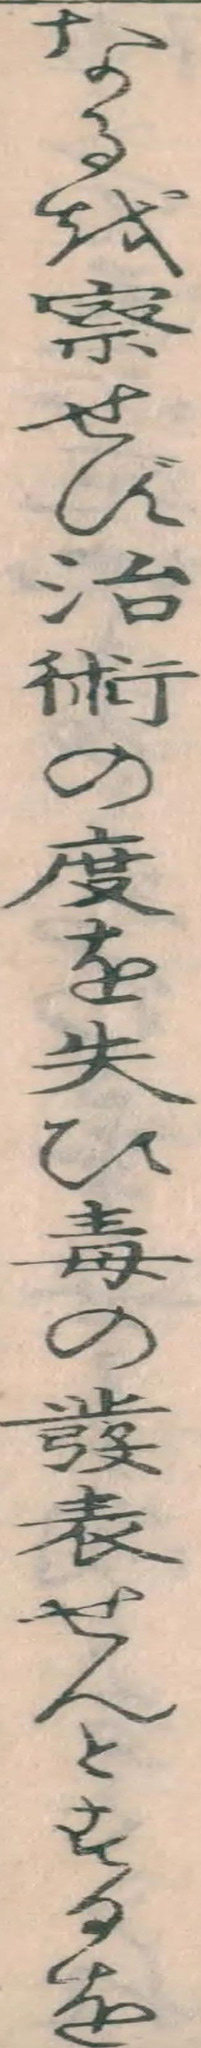なるを察せず治術の度を失ひ毒の發表せんするを

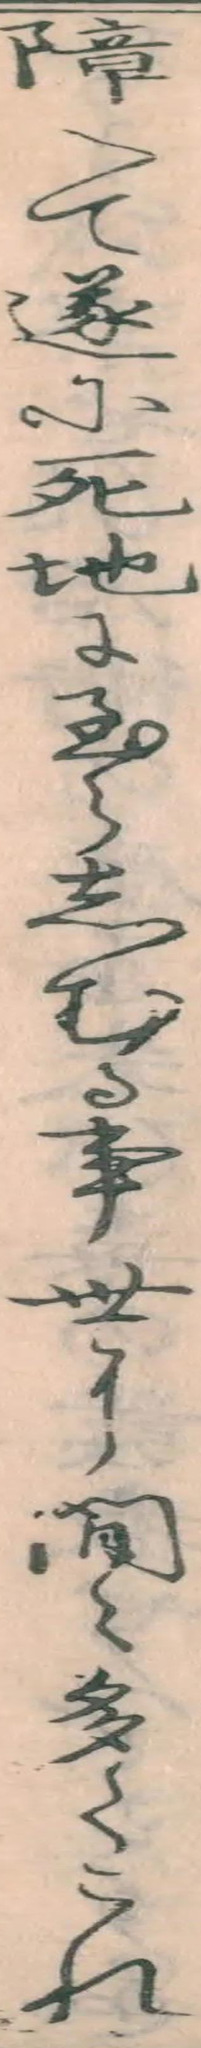障つて遂に死地に至らしむる事世に聞々多くこれ
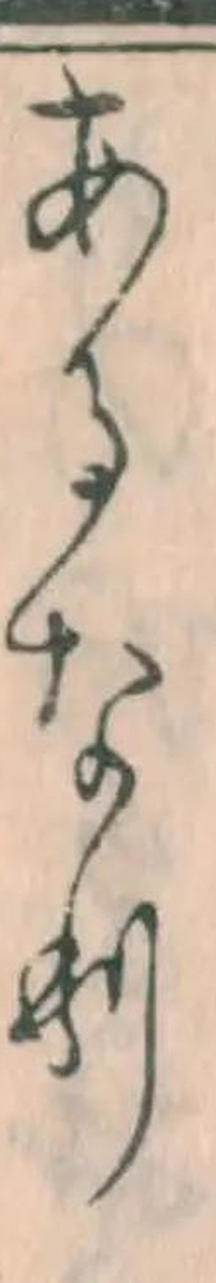あるなり
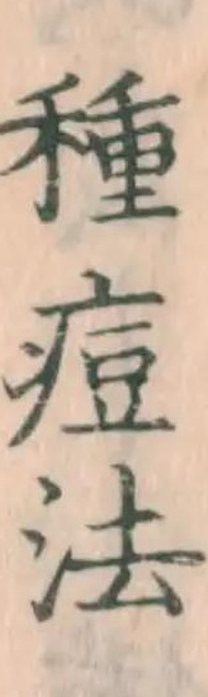種痘法
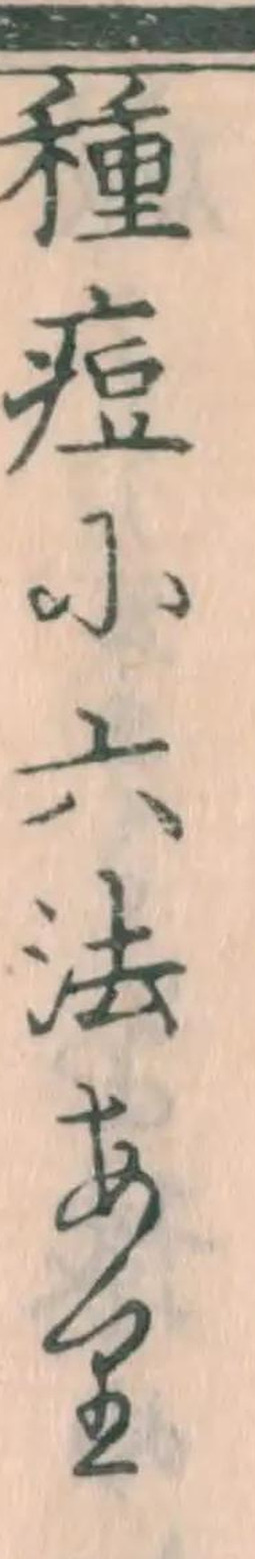種痘に六法あり
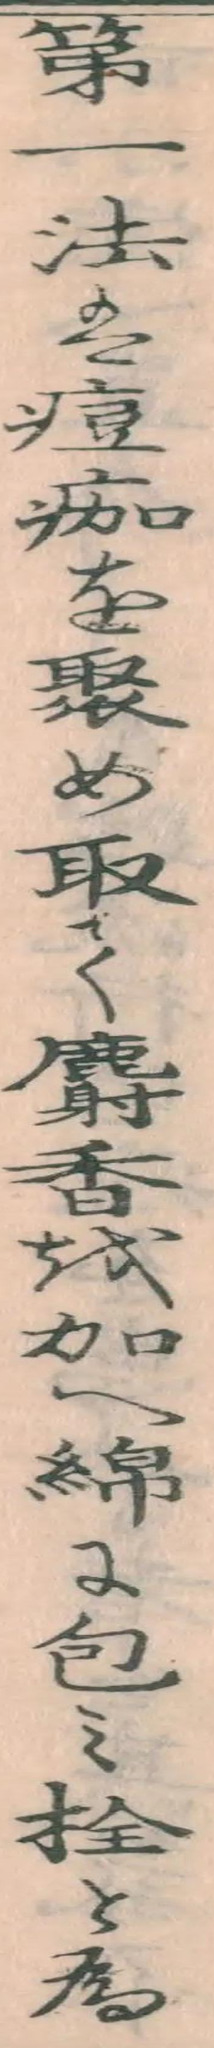第一法は痘痂を聚め取て麝香を加へ綿に包み栓と為
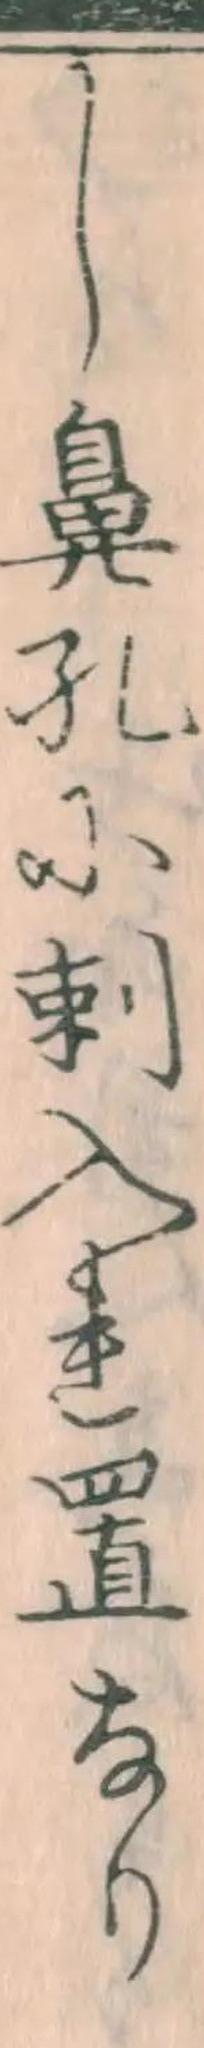し鼻孔に刺入れ置なり
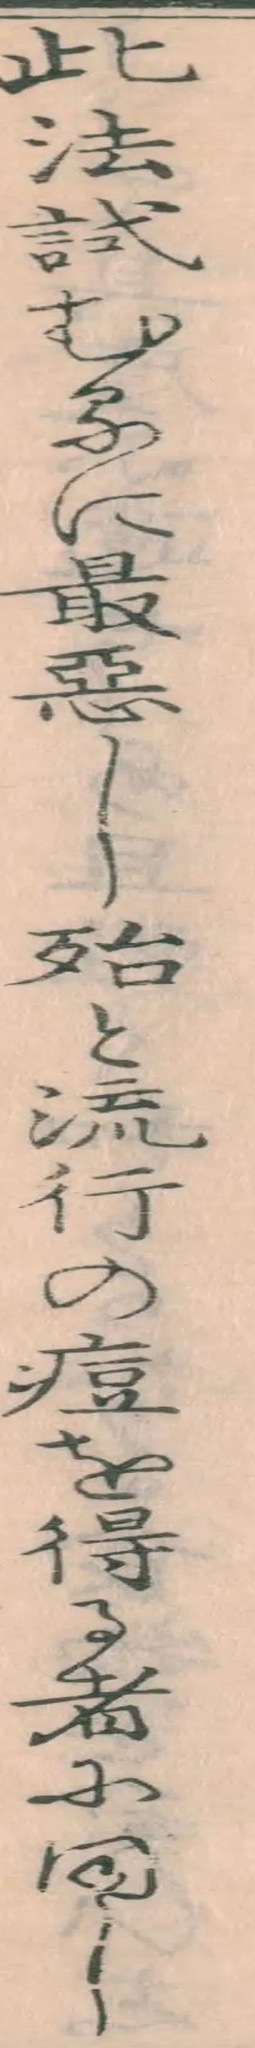此法試むるに最惡し殆と流行の痘を得る者に同し
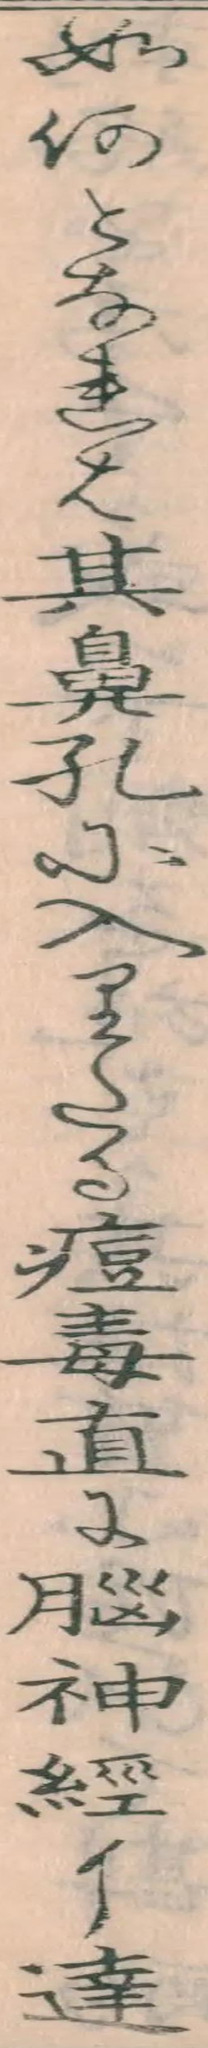如何となれは其鼻孔に入りたる痘毒直に脳神経に達
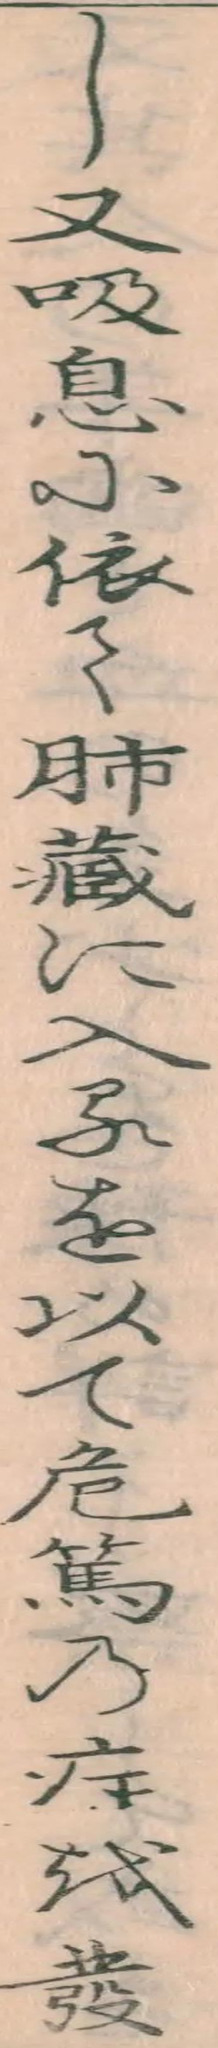し又吸息に依て肺臓に入るを以て危篤の痘を發
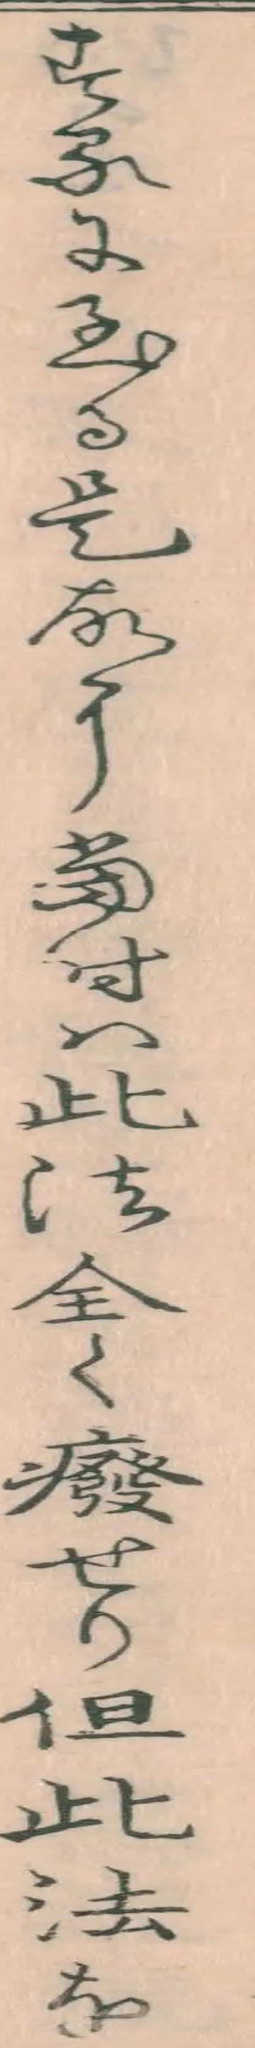するに至る是故に当時は此法全く廃せい但此法を
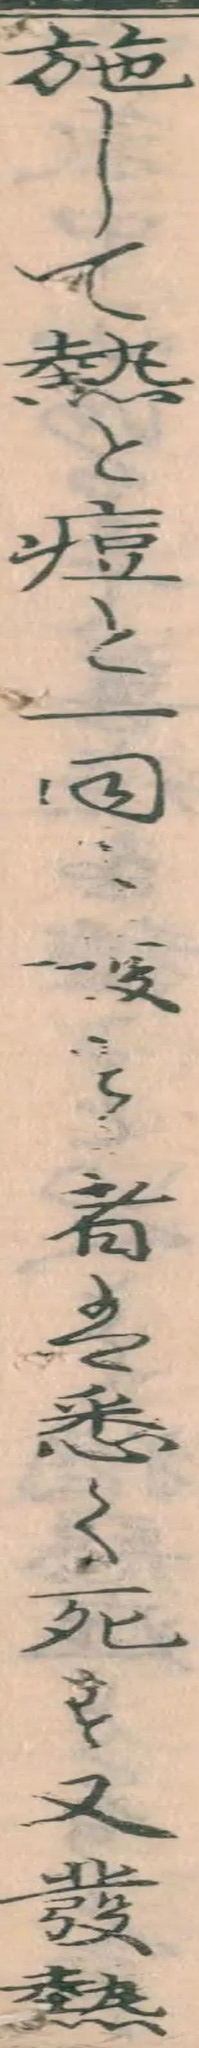施して熱と痘と一同者は悉く死す又發熱
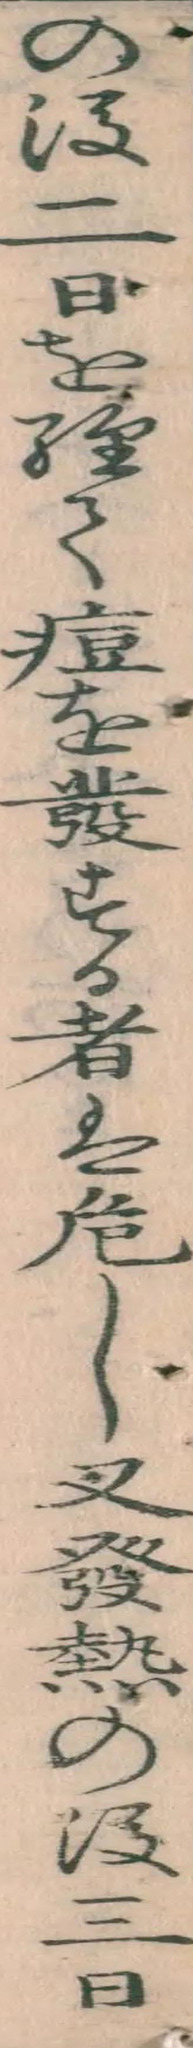の後二日を経て痘を發する者は危し又發熱の後三日
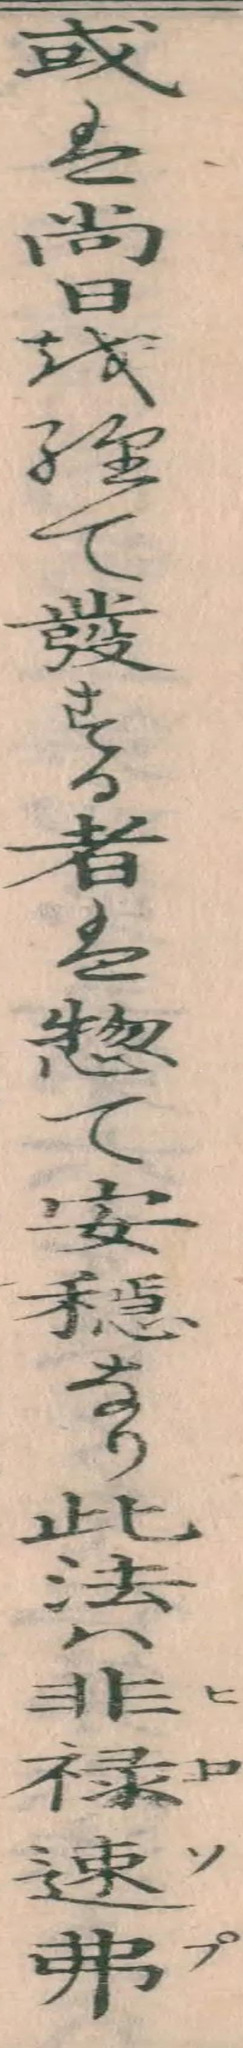或は尚日を経て發する者は惣て安穏なり此法は非禄速弗
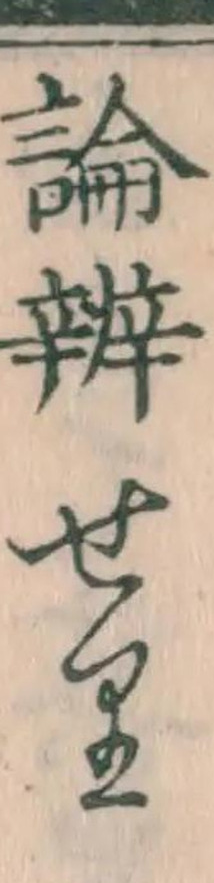論辨せり
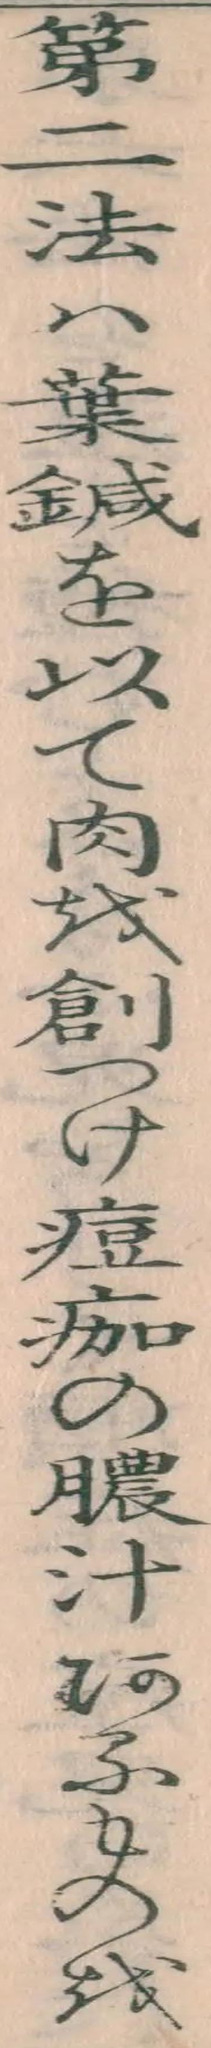第二法は葉鍼を以て肉を創つけ痘痂膿汁あるものを
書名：種痘新編
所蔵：国立国会図書館 National Diet Library, JAPAN
